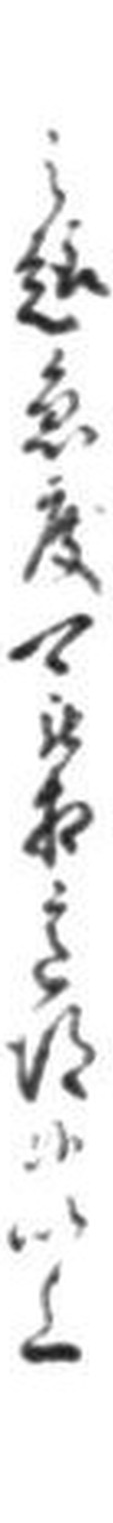之趣急度可被相意得候以上
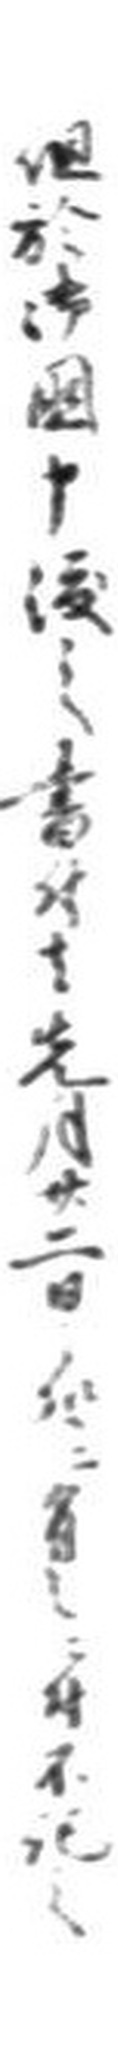但於御国申渡之書付者先月廿二日処ニ有之ニ付不記之
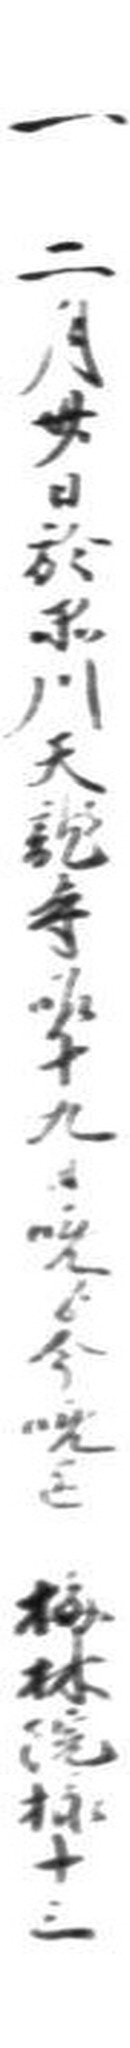一二月廿日於品川天龍寺昨十九日晩ゟ今暁迄梅林院様十三
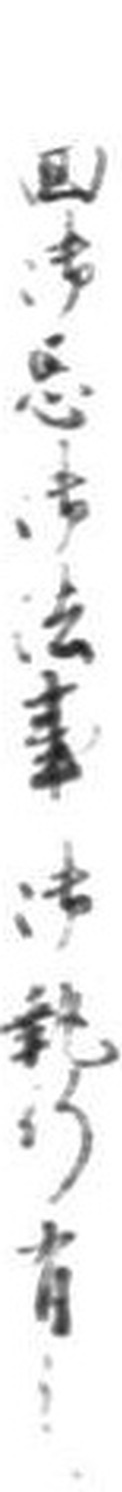回御忌御法事御執行有之
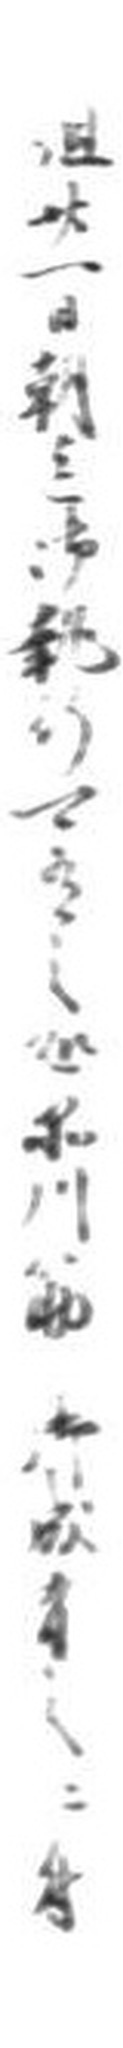但廿一日朝迄御執行可有之処品川筋御成有之ニ付
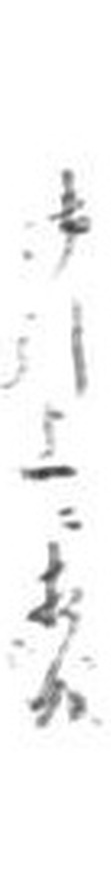御引上ニ相成
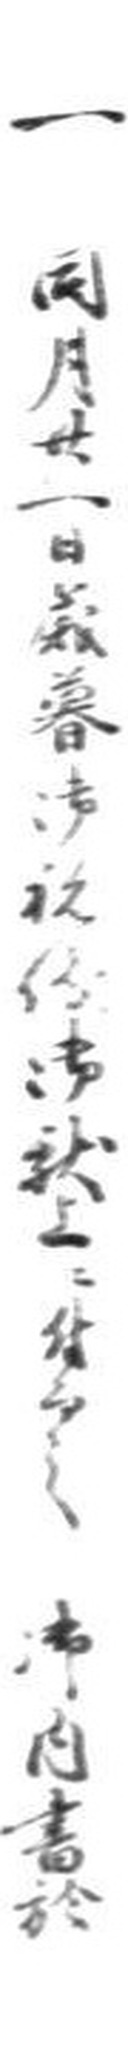一同月廿一日歳暮御祝儀御献上ニ付而之御内書於
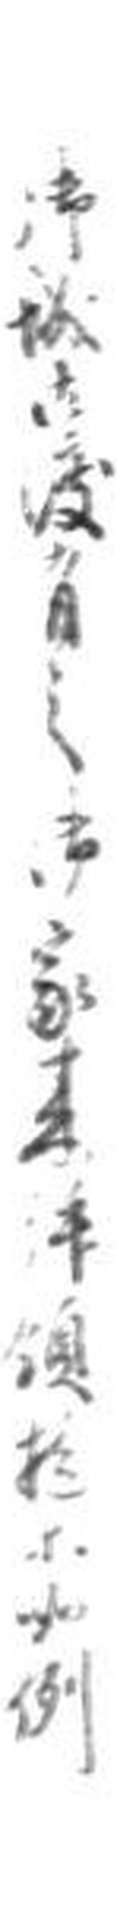御城御渡有之御家来拝領物等如例
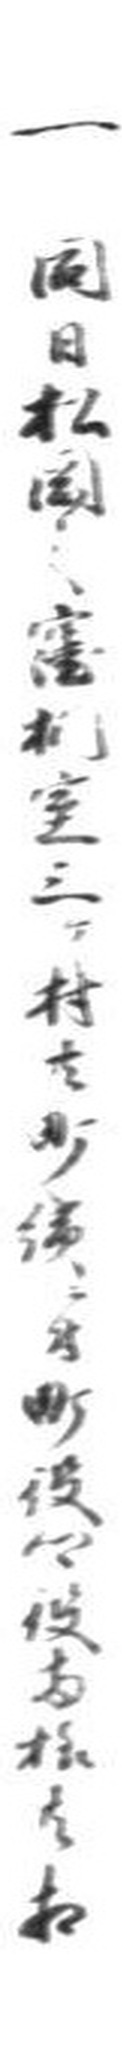一同日松岡之窪椚室三ケ村共打続ニ付町役郷役両様共相
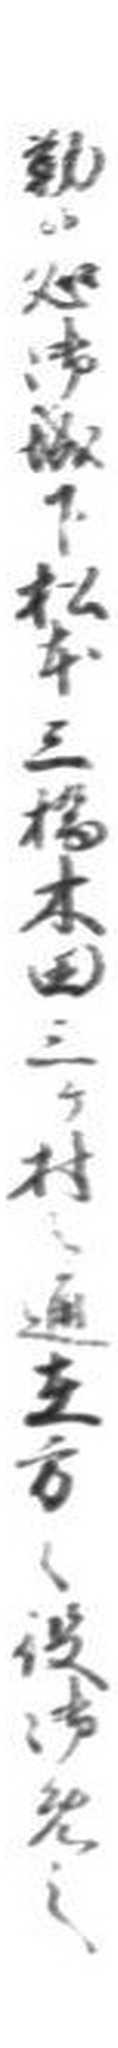勤候処御城下松本三橋木田三ケ村之通在方之役御免之

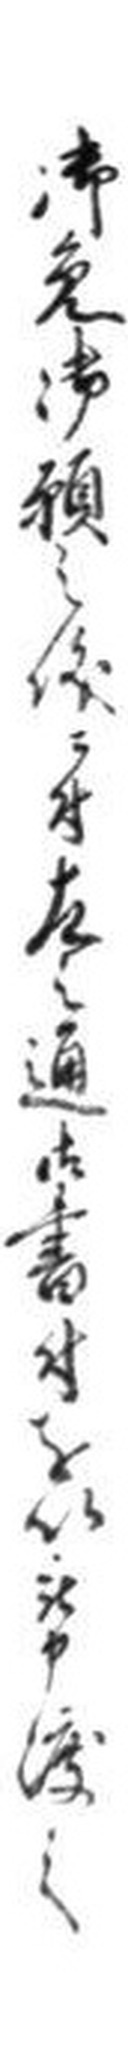御免御願之儀ニ付左之通御書付を以被申渡之
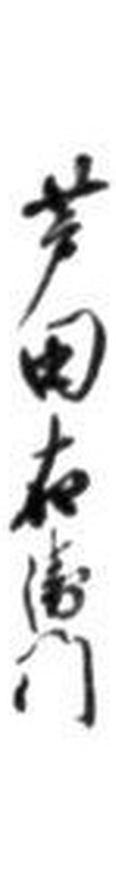芦田右衛門
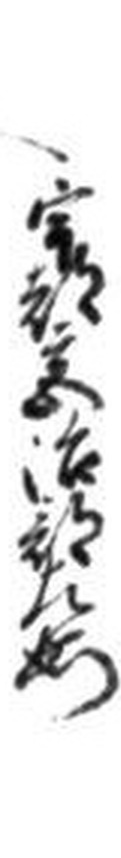宇都宮治部左衛門
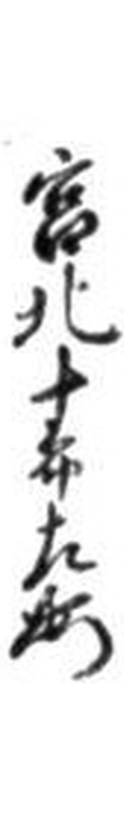宮北十郎左衛門
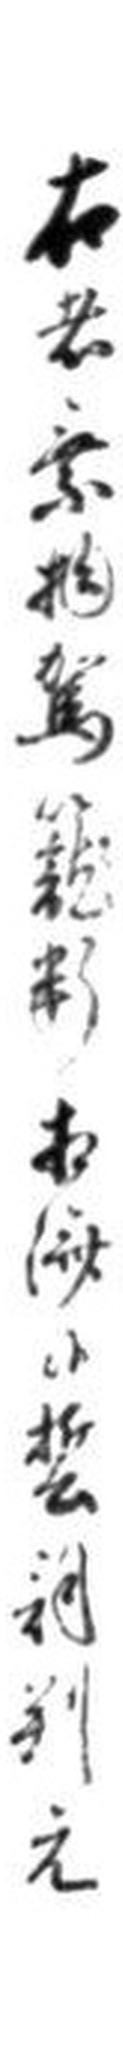右者乗物駕籠断相済候誓詞判元
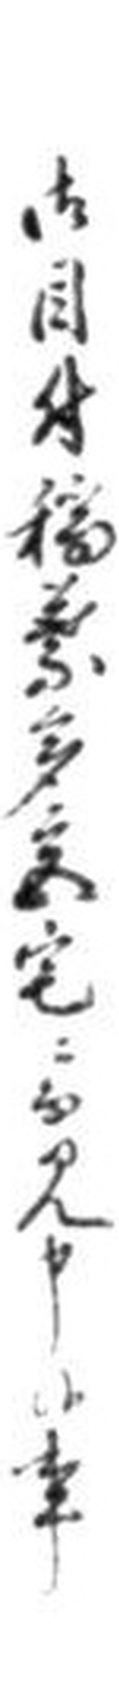御目付稲葉多宮宅ニ而見申候事
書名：家譜 三十六 宗昌公 従享保八年到同九年
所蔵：福井県文書館 Fukui Prefectural Archives
